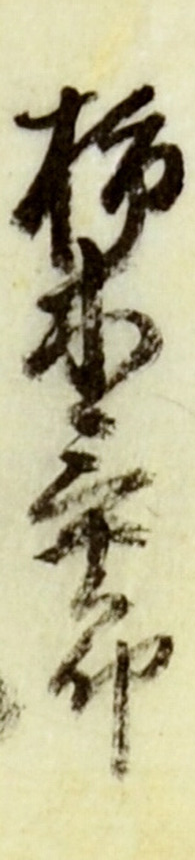栃木三十郎
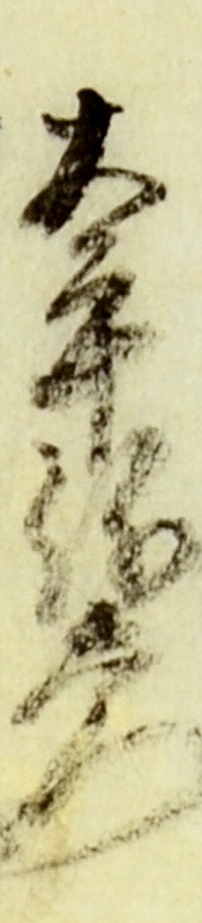大平治右衛門
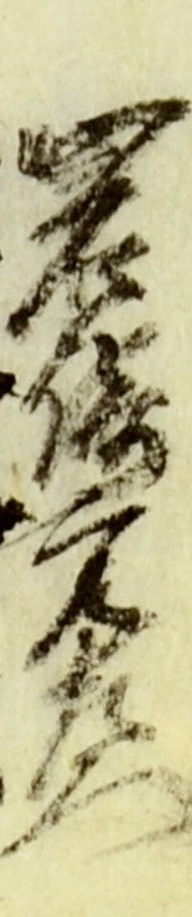岩崎覚左衛門
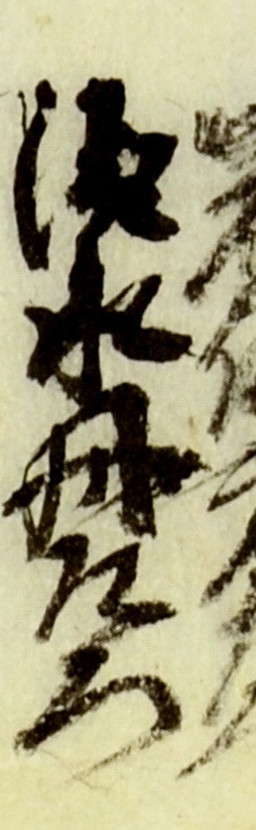清水丹左衛門
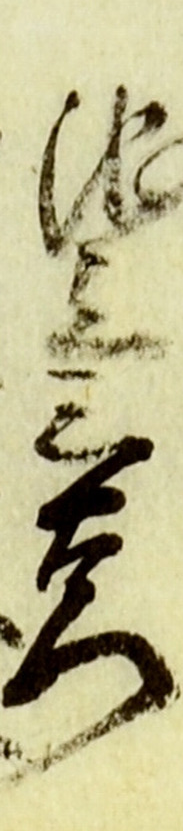池上三右衛門
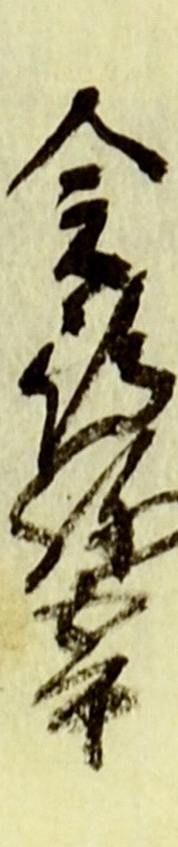金嶋弥五平
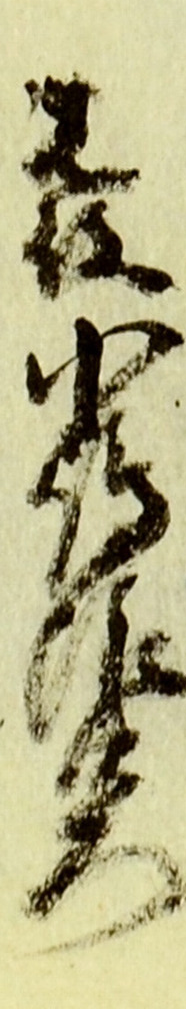先役小嶋治右衛門
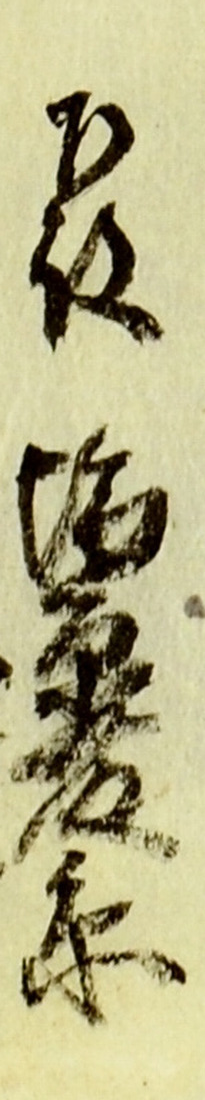下役塩原藤衛
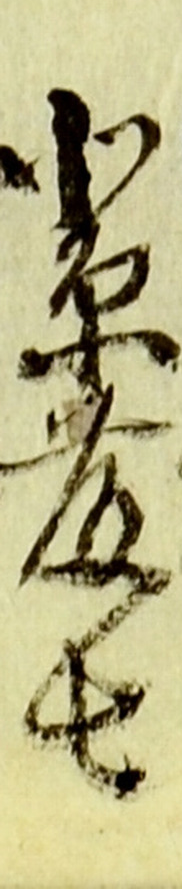北原藤七
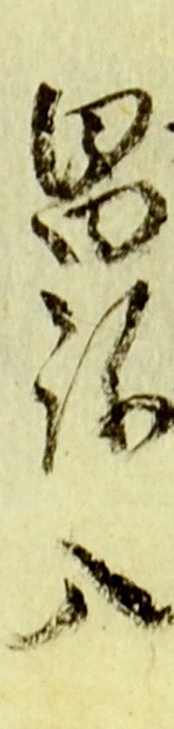畠弥八
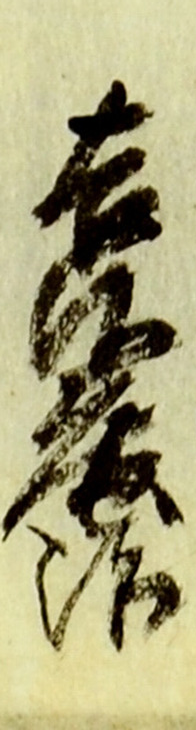吉沢廣治
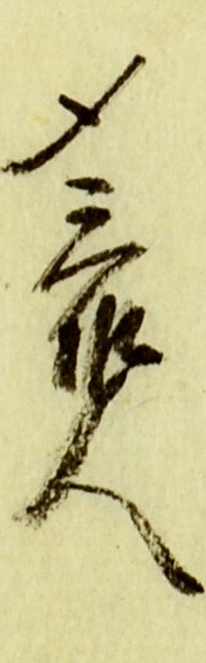〆三拾人

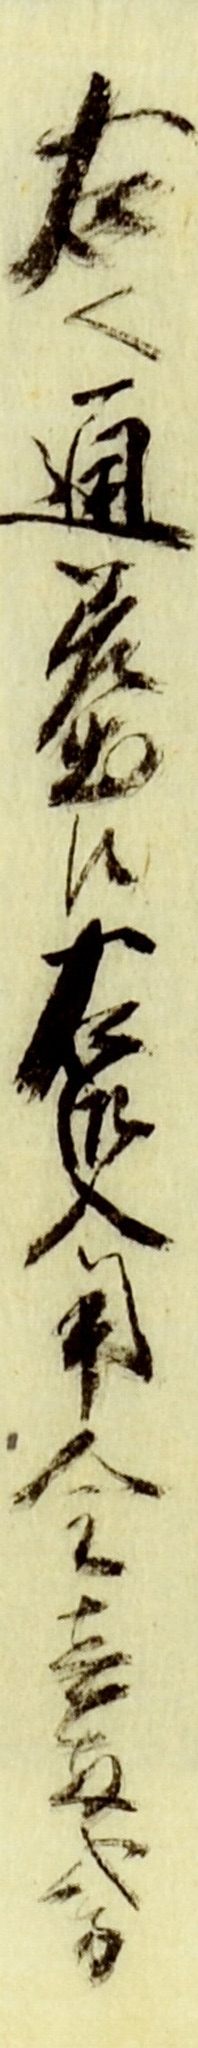右之通差出候右御入用金壱両弐分
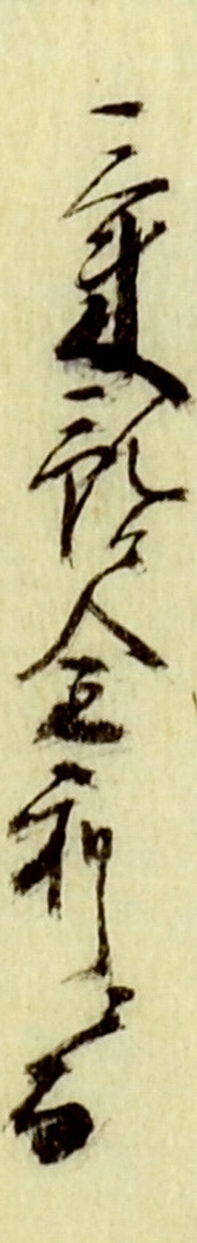三朱預ケ金利ニ而
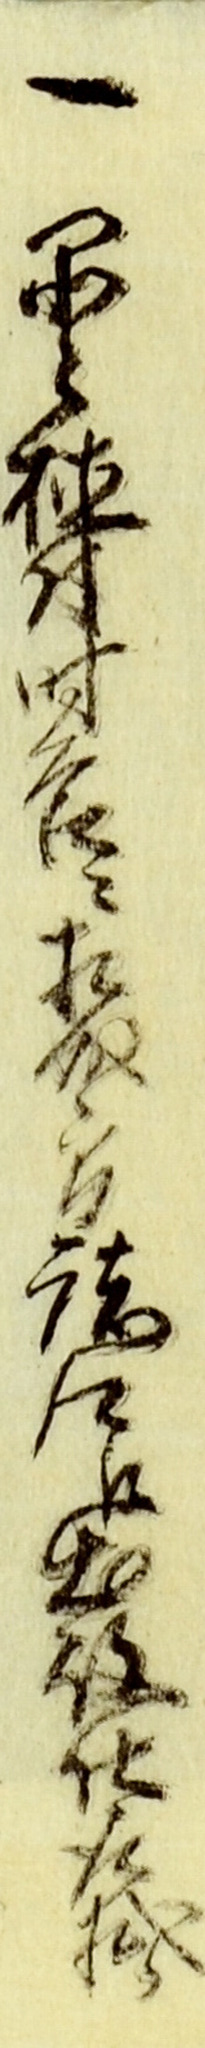一品々植付時節ニ相成候間諸郷江出役仕取掛り
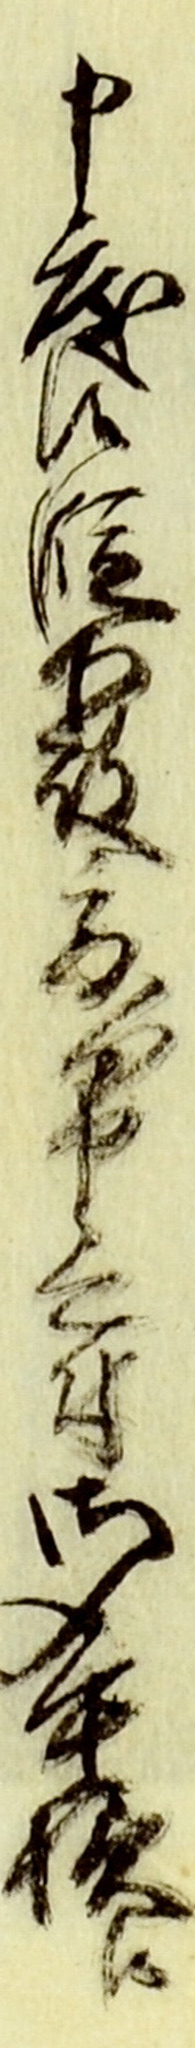申度候段下役方ゟ申候付御〆中様江
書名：諸事御用留
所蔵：伊那市立高遠町図書館・合同会社AMANE
